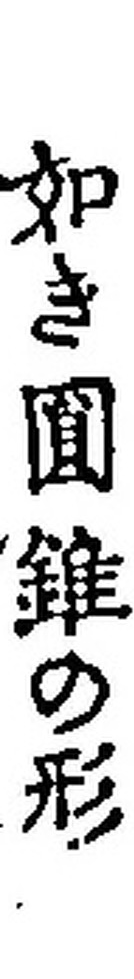如き圓錐の形
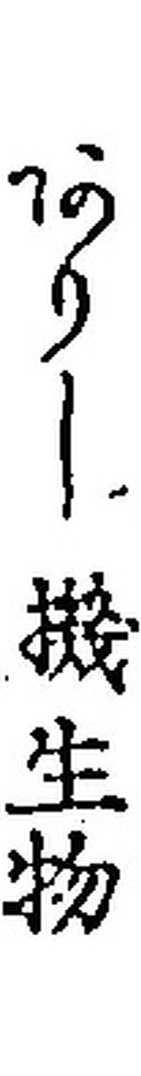ありし機生物
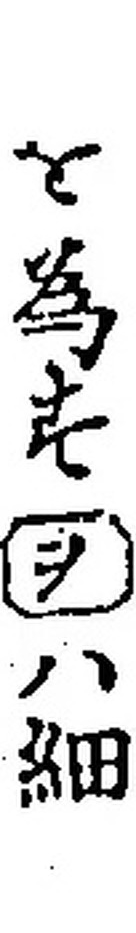を為すヲは細
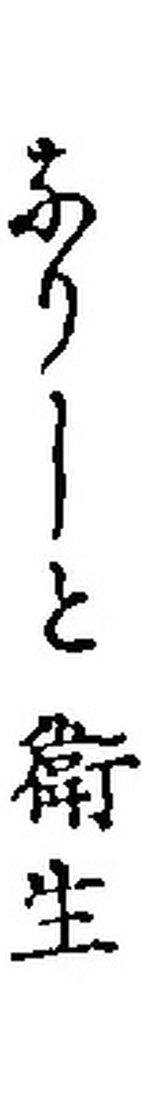なりしと衛生
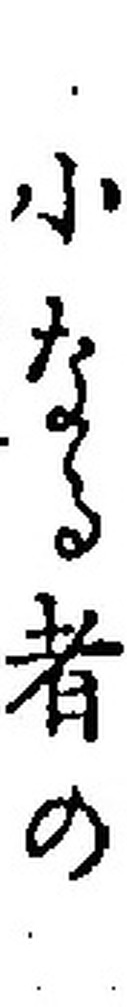少なる者の
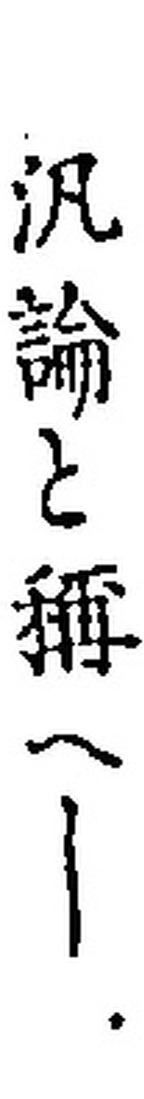汎論と稱へし
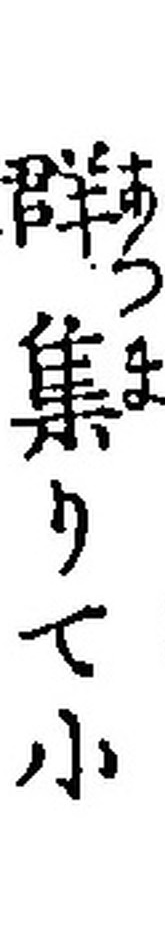群集りて少
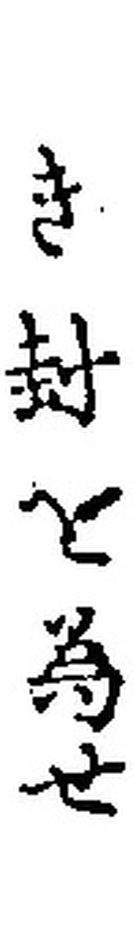き封を為せ
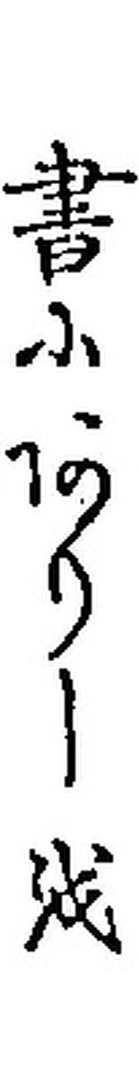書にありしを
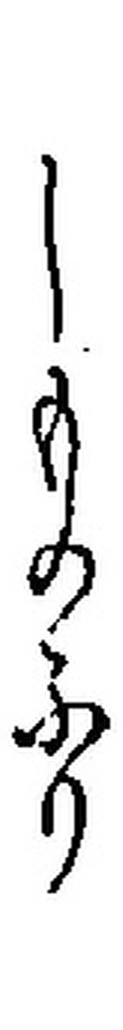しものなり
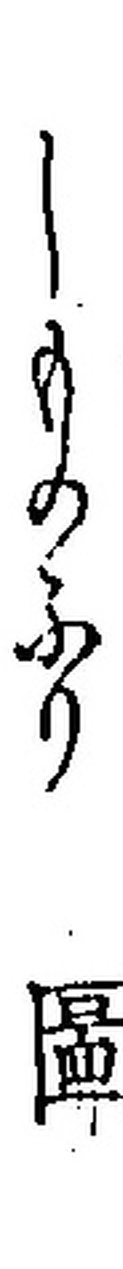しものなり
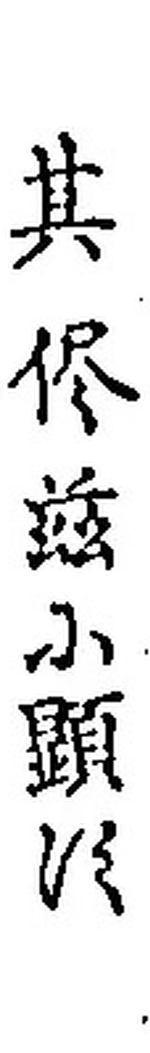其侭茲に顕す

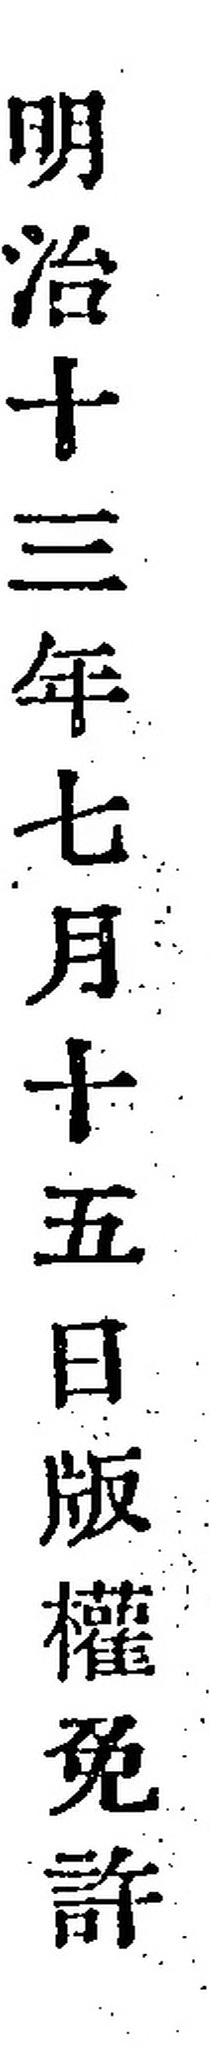明治十三年七月十五日版權免許
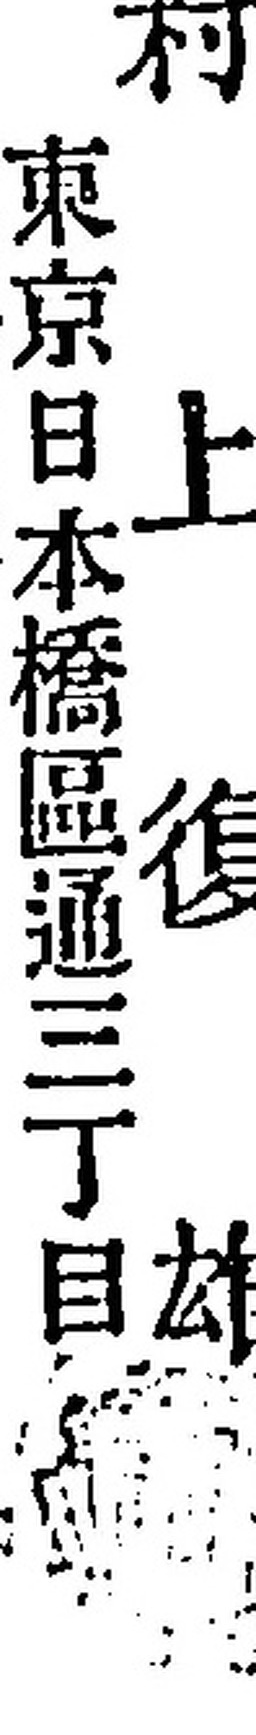賣東京日本橋區通壹丁目
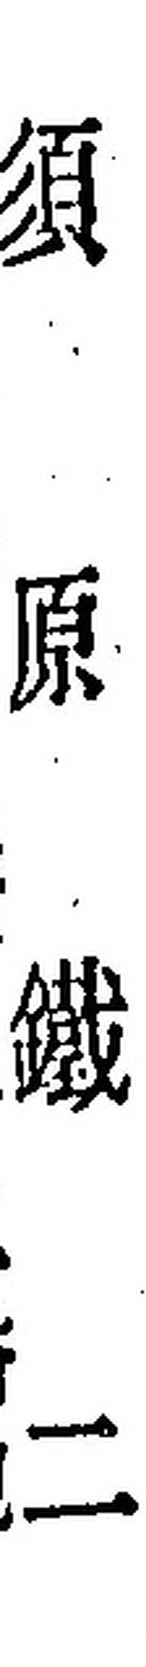須原鐵二
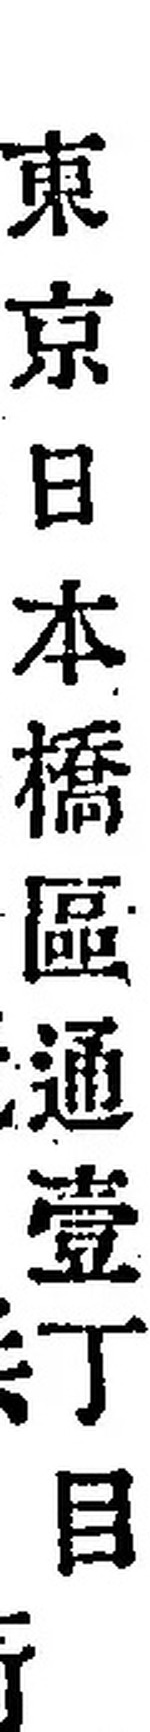賣東京日本橋區通壹丁目
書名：飲水の心得 : 伝染病の予防
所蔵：国立国会図書館 National Diet Library, JAPAN
